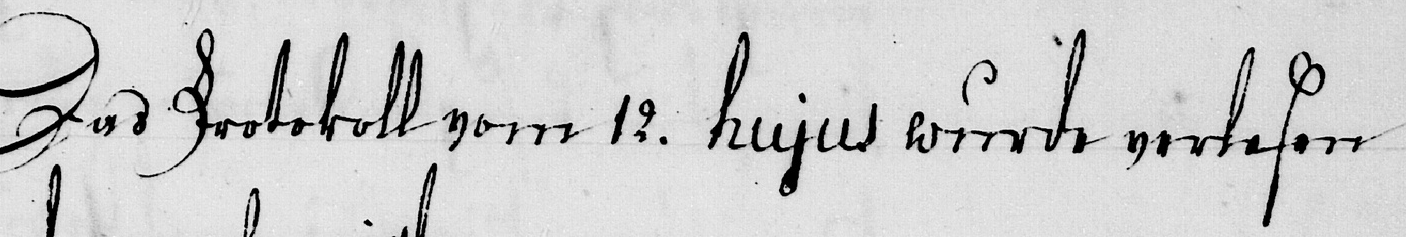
Das Protokoll vom 12. hujus wurde verlesen
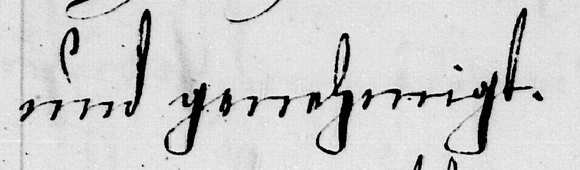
und genehmigt.
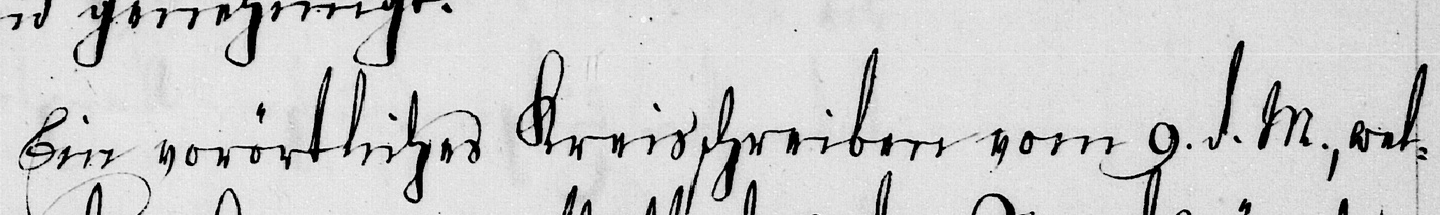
Ein vorörtliches Kreisschreiben vom 9. d. M., wel¬
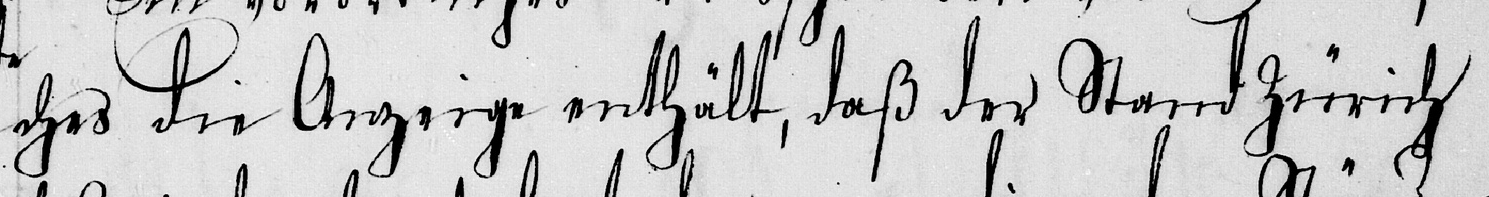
ches die Anzeige enthält, daß der Stand Zürich
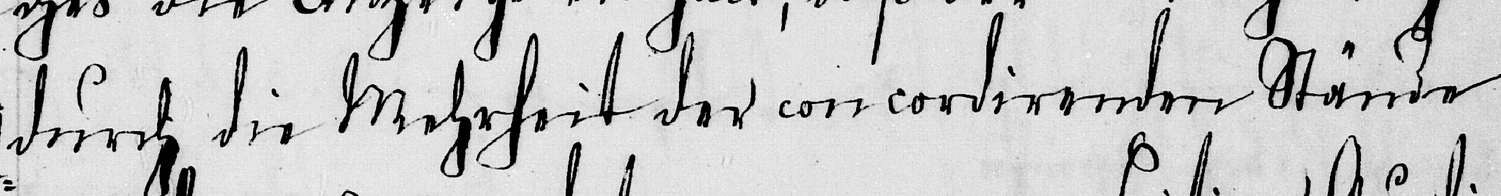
durch Mehrheit der concordirenden Stände
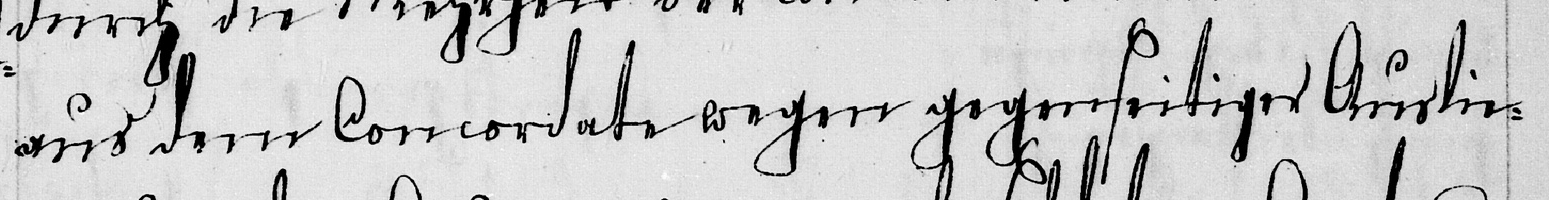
aus dem Concordate wegen gegenseitiger Auslie¬
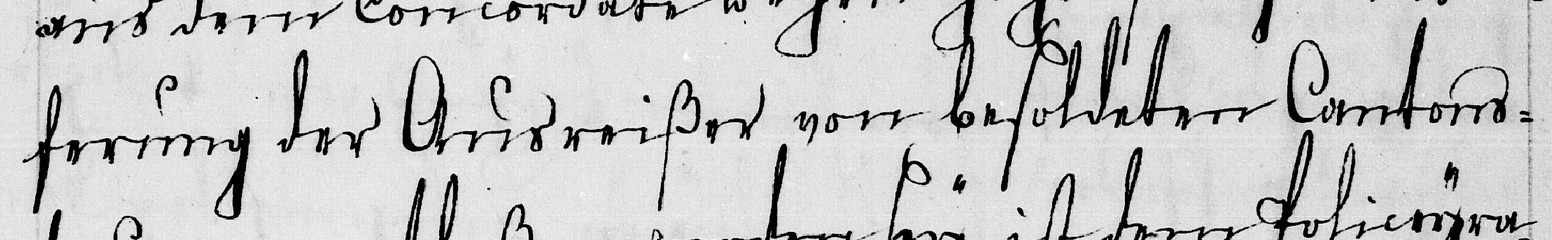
ferung der Ausreißer von besoldeten Cantons¬
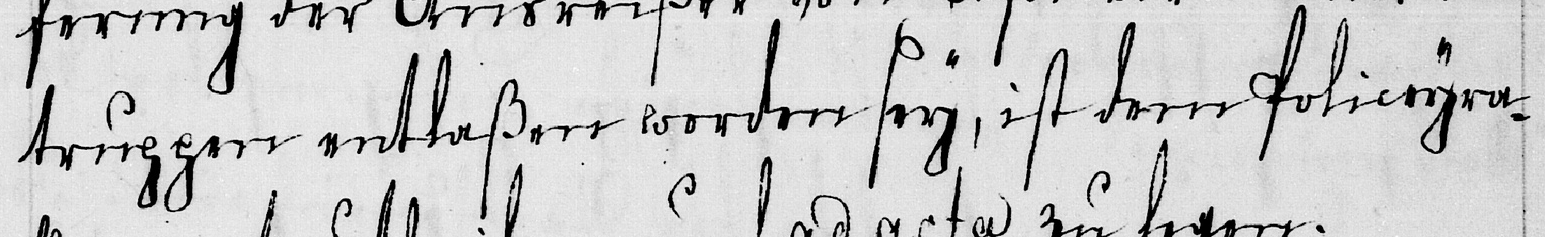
truppen entlaßen worden sey, ist dem Policeyra¬
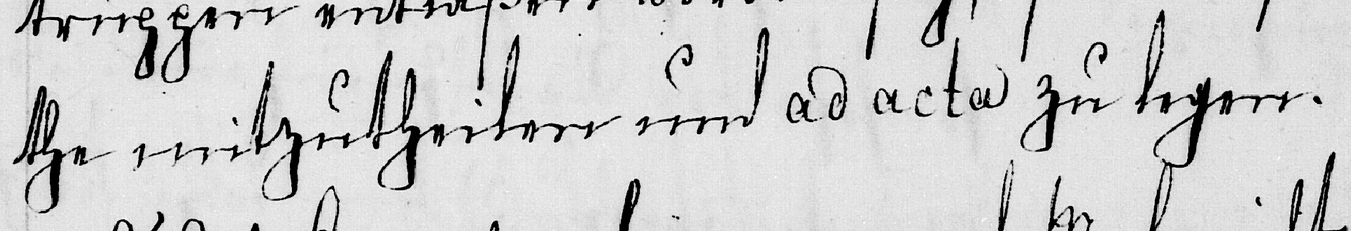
the mitzutheilen und ad acta zu legen.
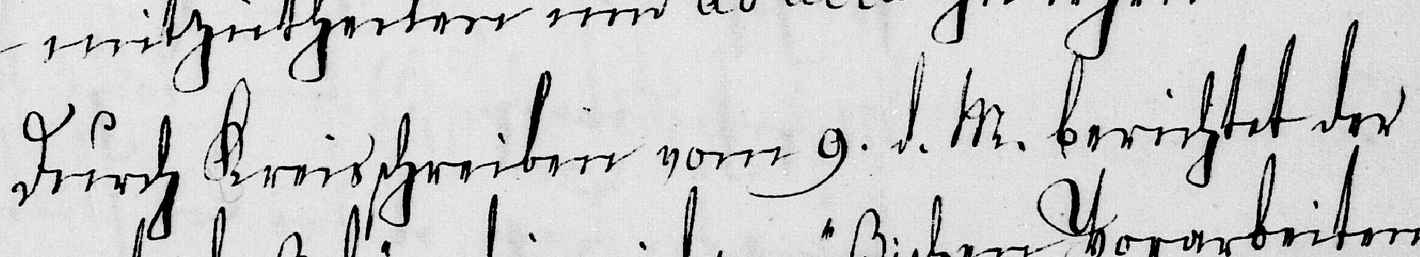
Durch Kreisschreiben vom 9. d. M. berichtet der
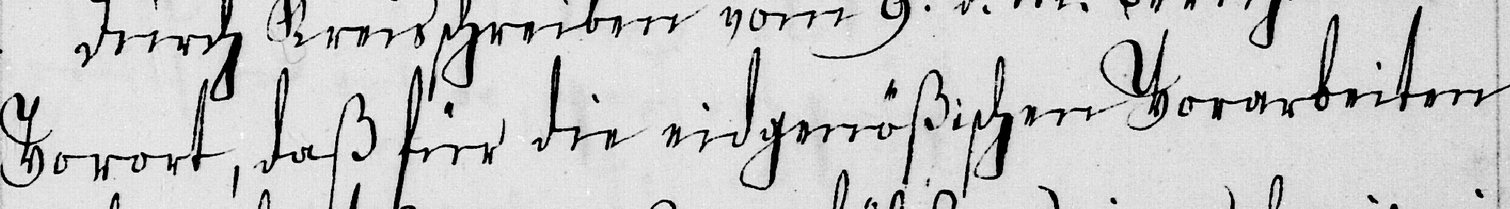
Vorort, daß für die eidgenößischen Vorarbeiten
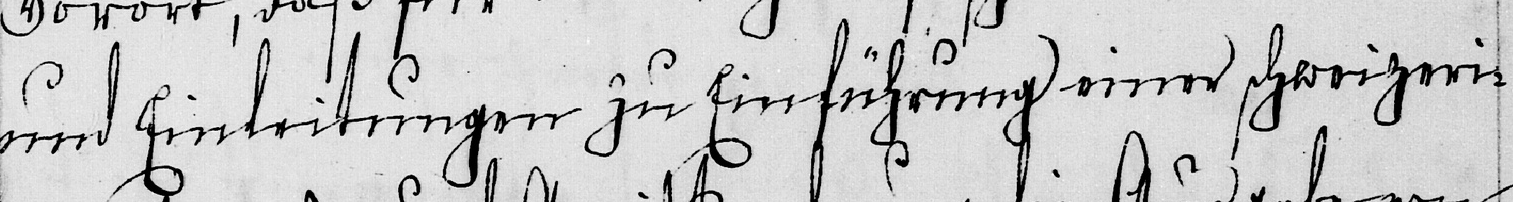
und Einleitungen zu Einführung einer schweizeri¬
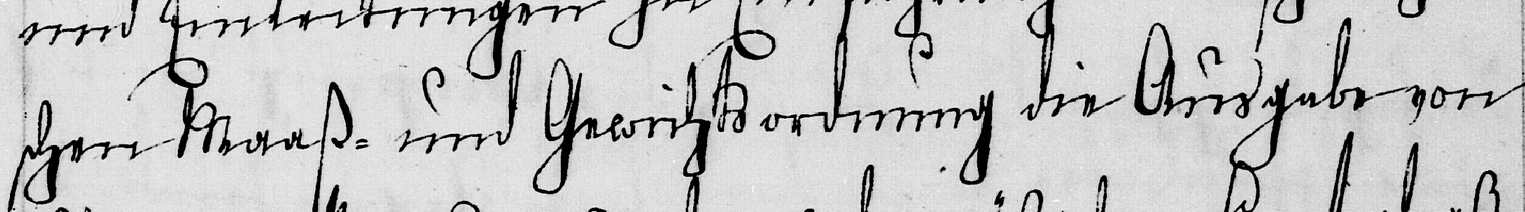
schen Maaß- und Gewichtsordnung die Ausgabe von
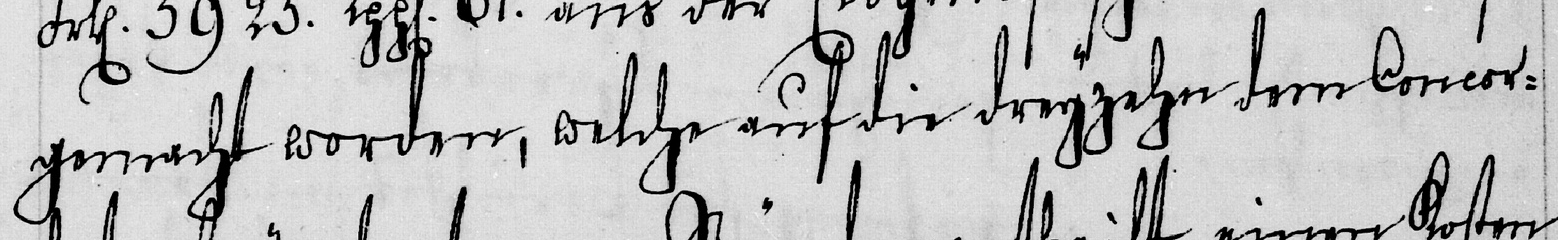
gemacht worden, welche auf die dreyzehn dem Concor¬
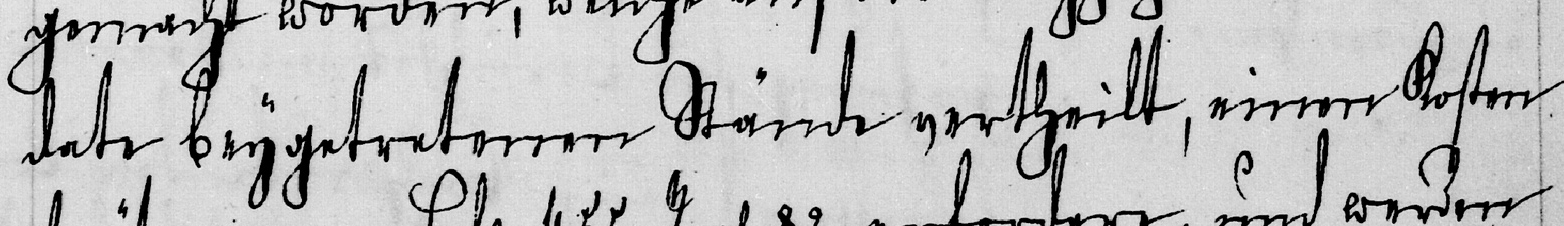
date beygetretenen Stände ertheilt, einen Kosten¬
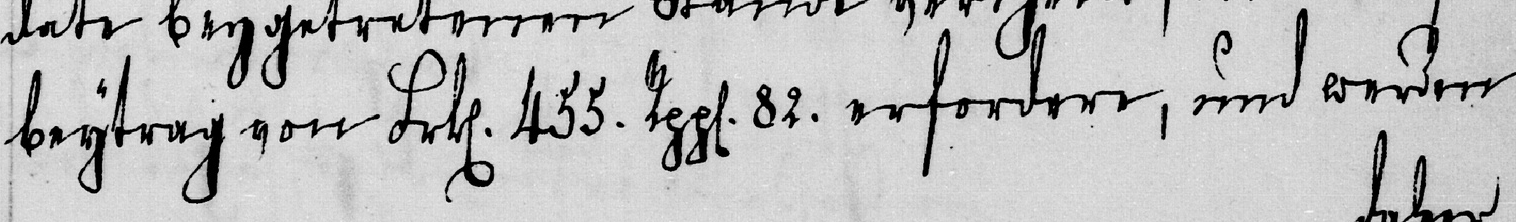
beytrag von Frk[en]. 455. Rpp[en] 82. erfordere, und werden
